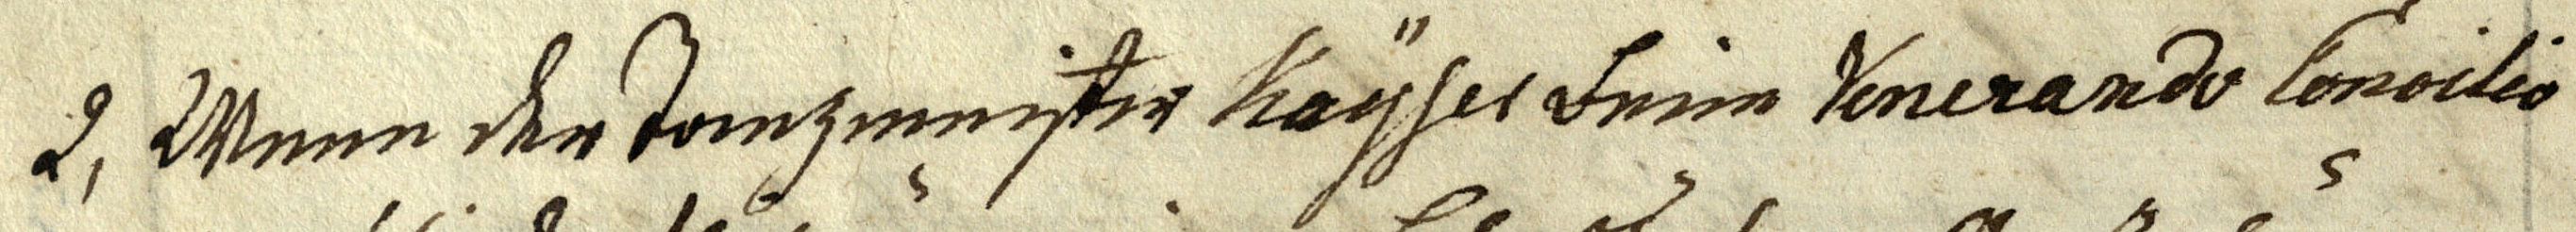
2, Wenn der Tanzmeister Kaÿser beim Venerando Concilio
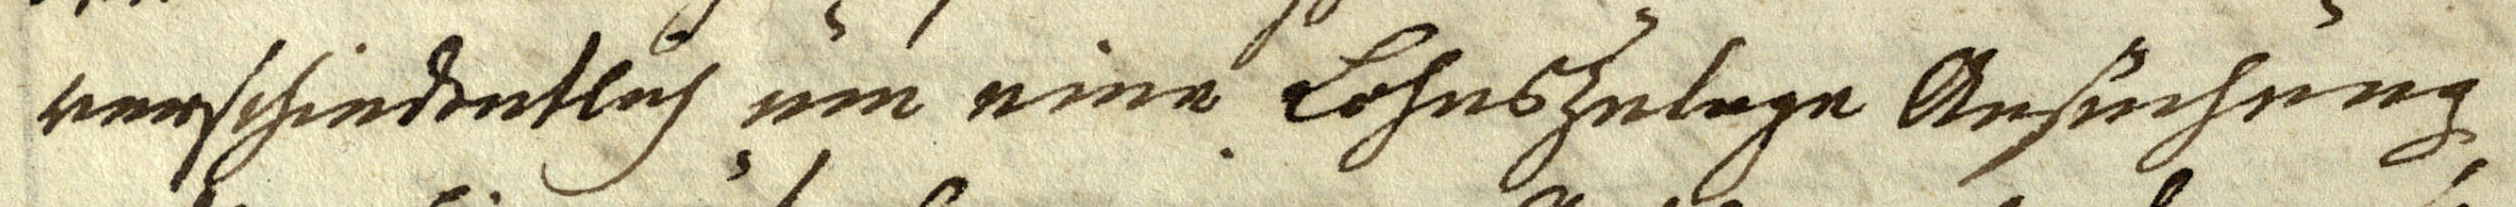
verschiedentlich um eine Lohnszulage Ansuchung
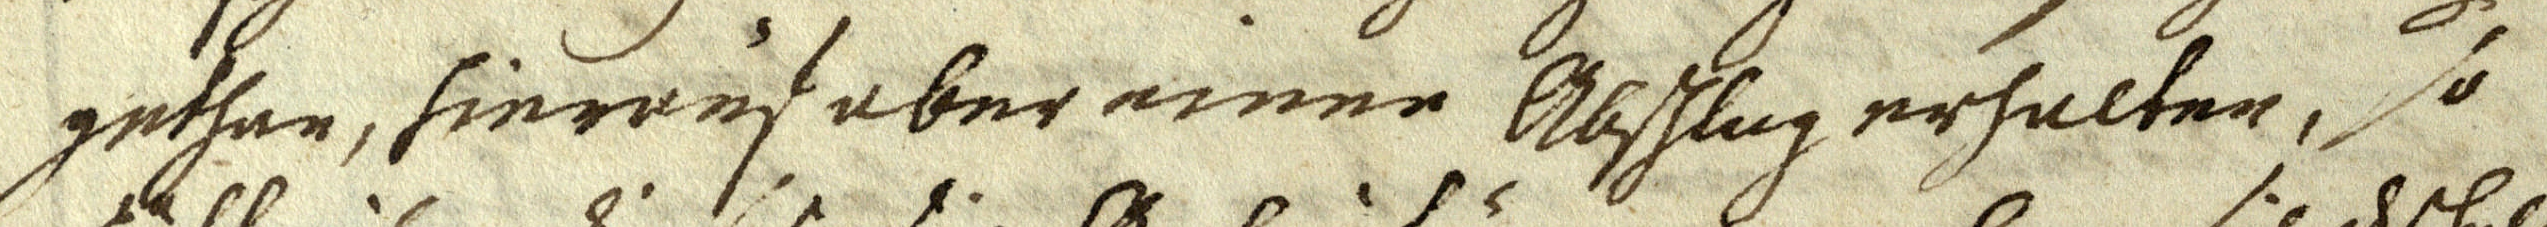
gethan, hierauf aber einen Abschlag erhalten, so
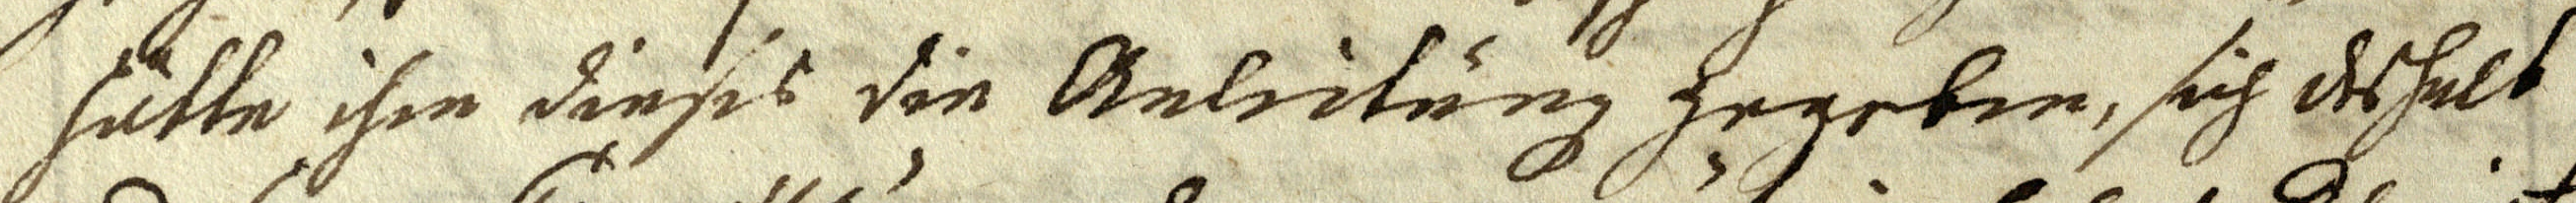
hätte ihm dieses die Anleitung gegeben, sich deshalb
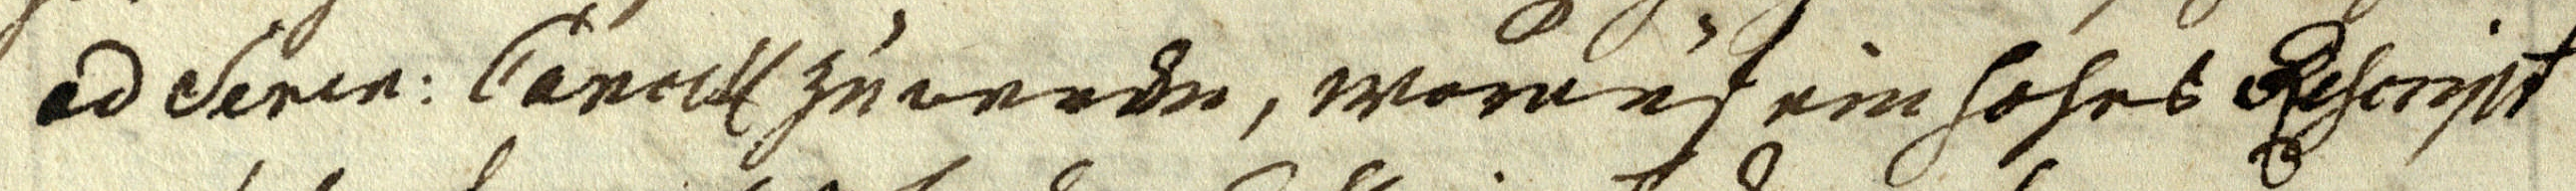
ad Seren. Cancell. zu wenden, worauf ein hohes Rescript
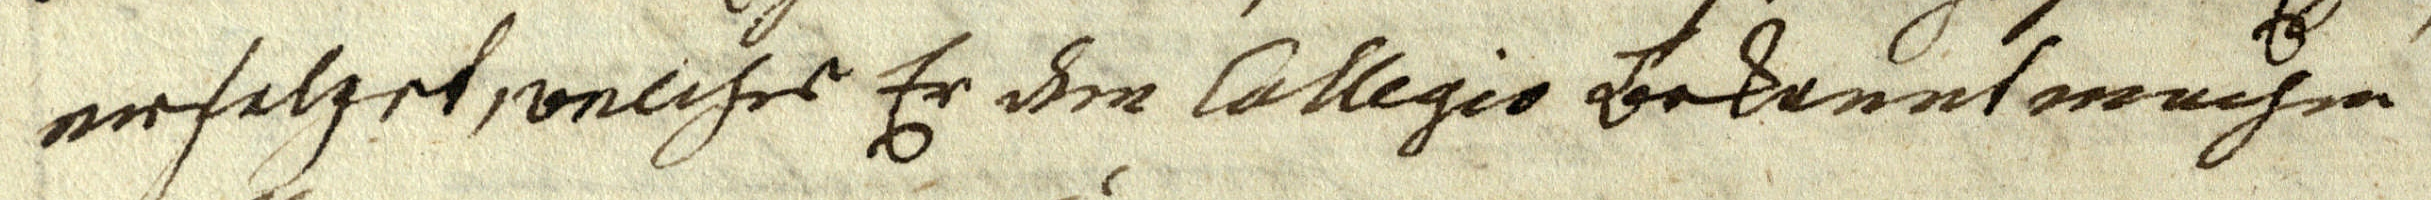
erfolget, welches Er dem Collegio bekannt machen
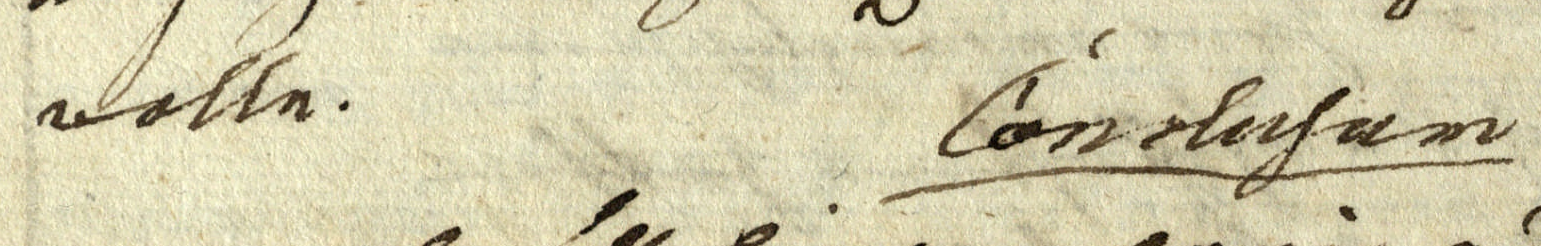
wolle. Conclusum
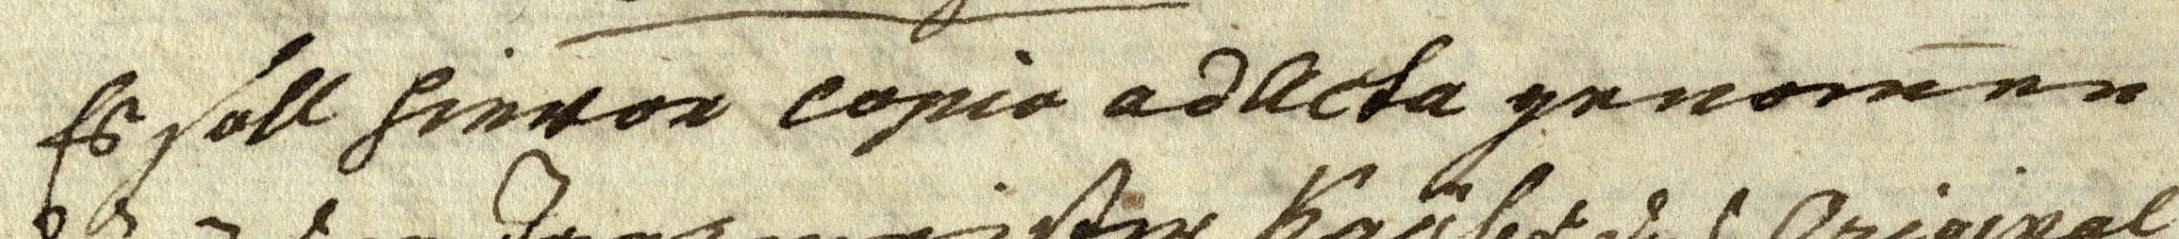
Es soll hievon copia ad Acta genomen
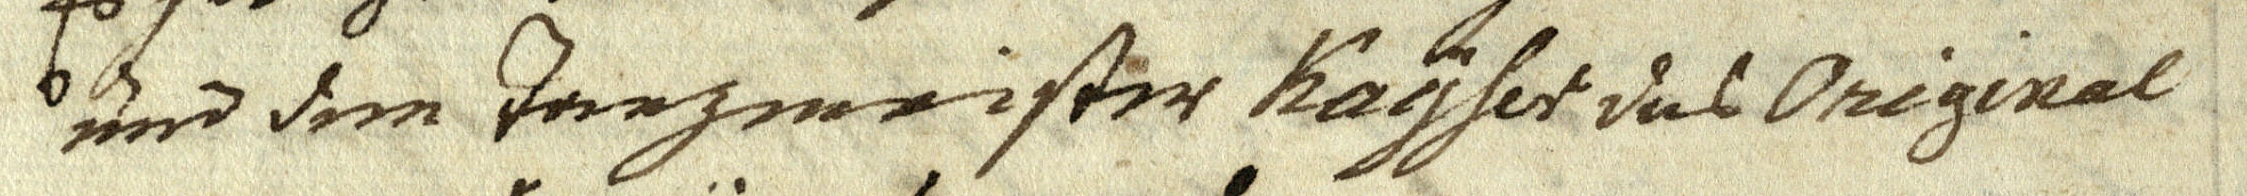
und dem Tanzmeister Kaÿser das Original
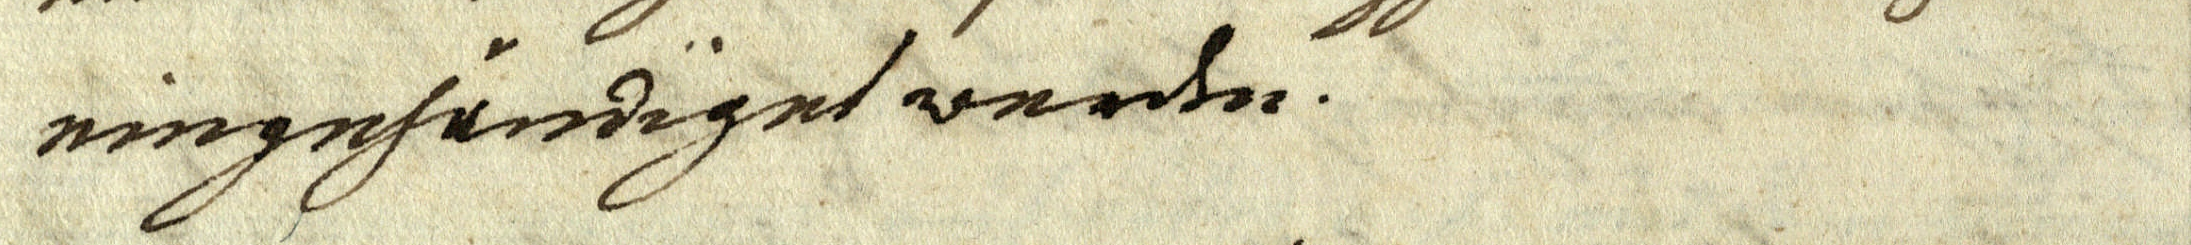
eingehändiget werden.
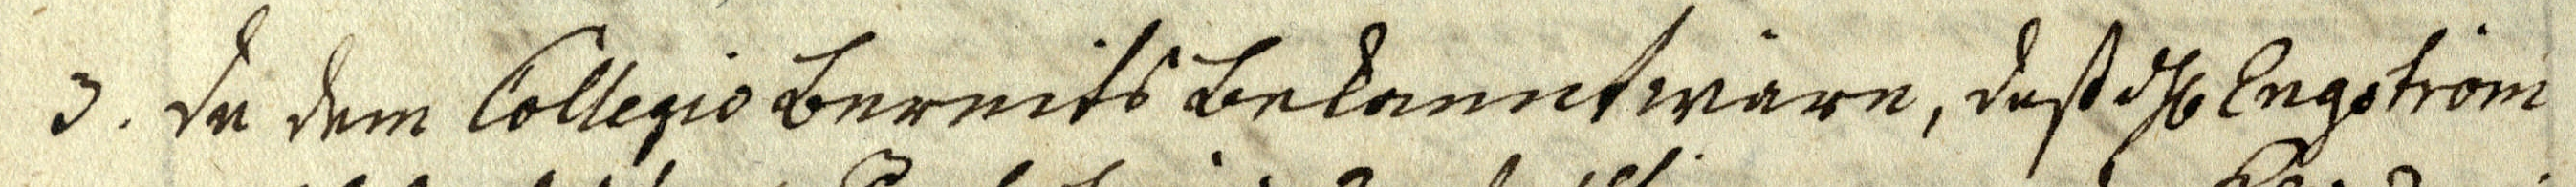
3. Da dem Collegio bereits bekannt wäre, daß dh. Engström
